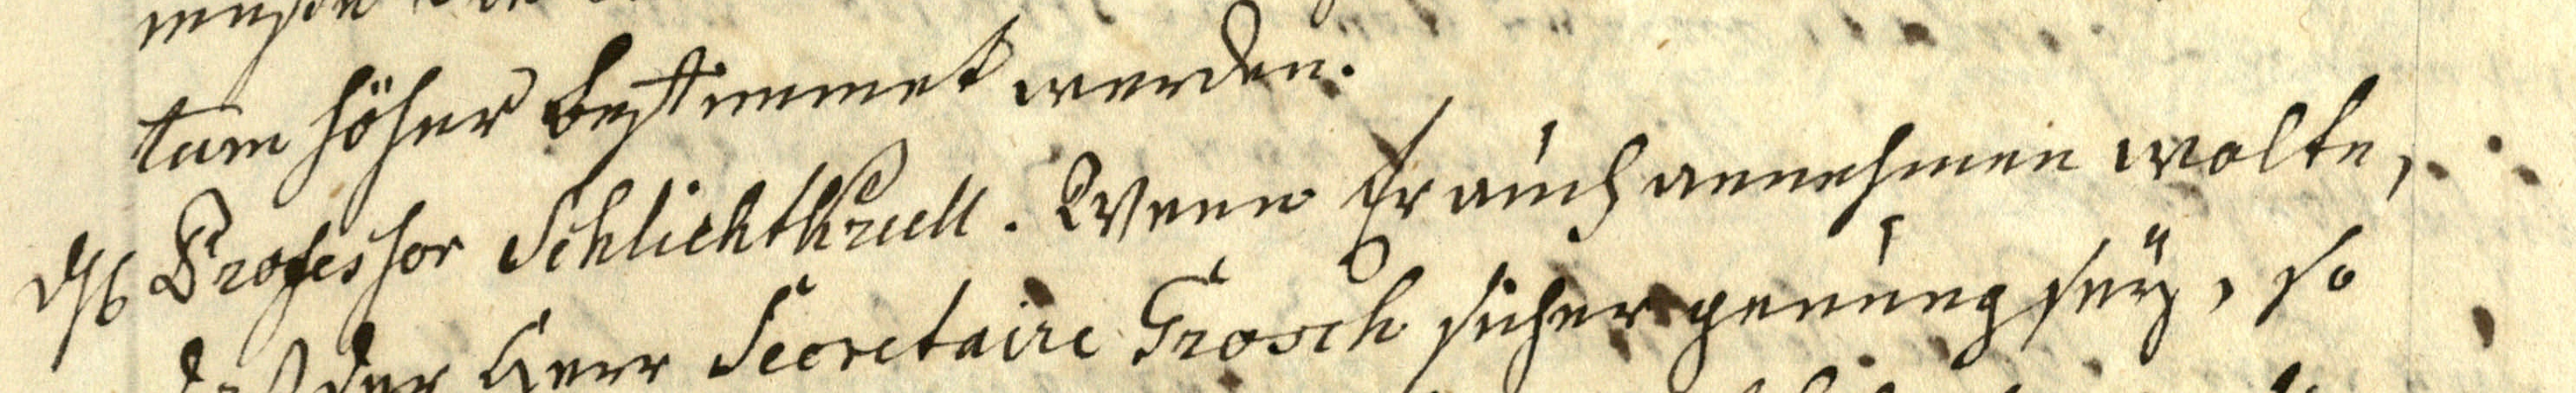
dh. Professor Schlichtkull. Wenn Er auch annehmen wolte,
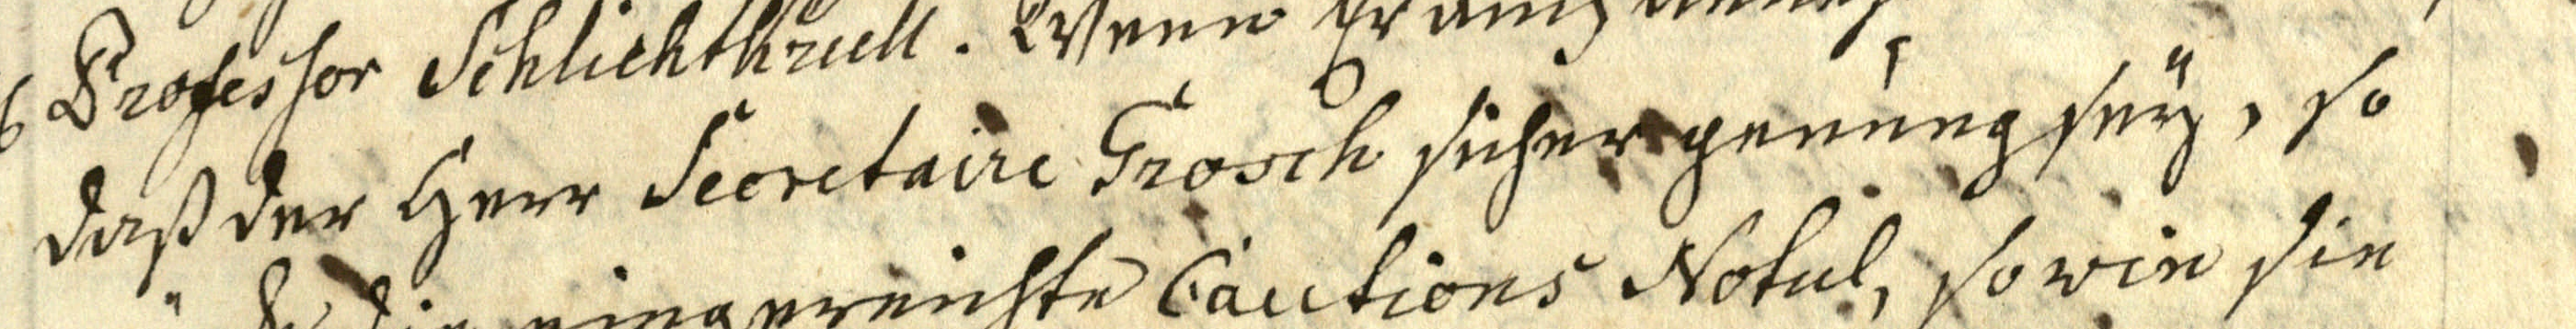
daß der Herr Secretaire Grosch sicher genug seÿ, so
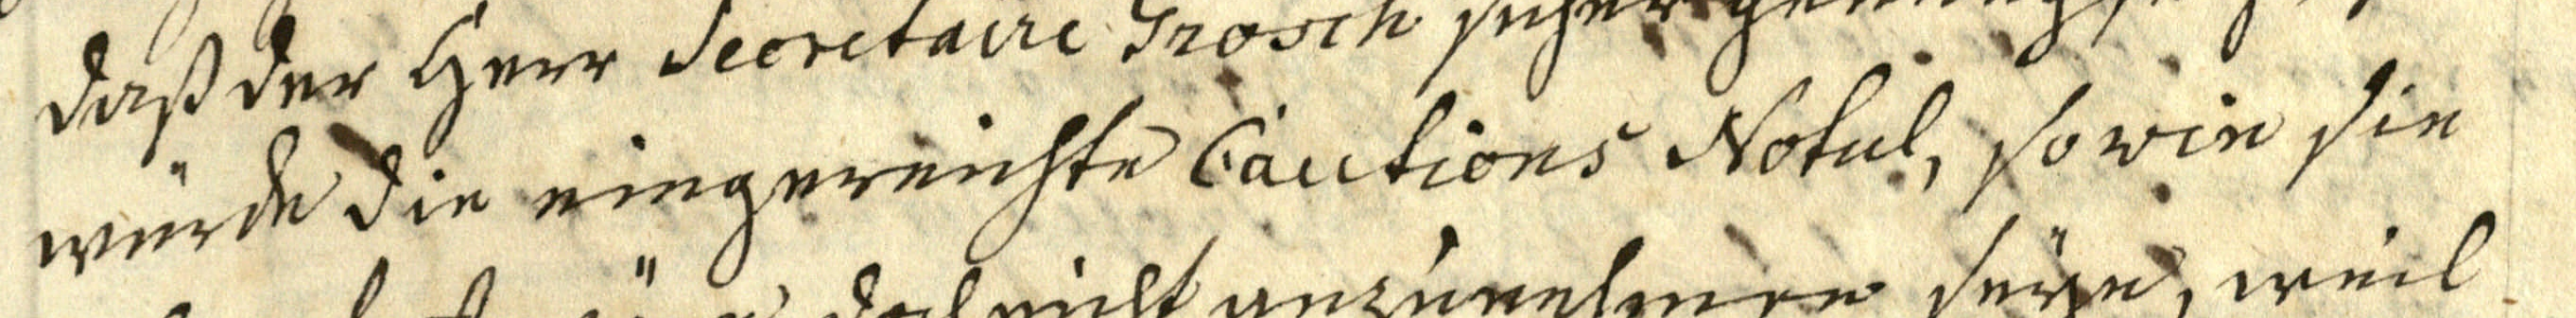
würde die eingereichte Cautions Notel, so wie sie
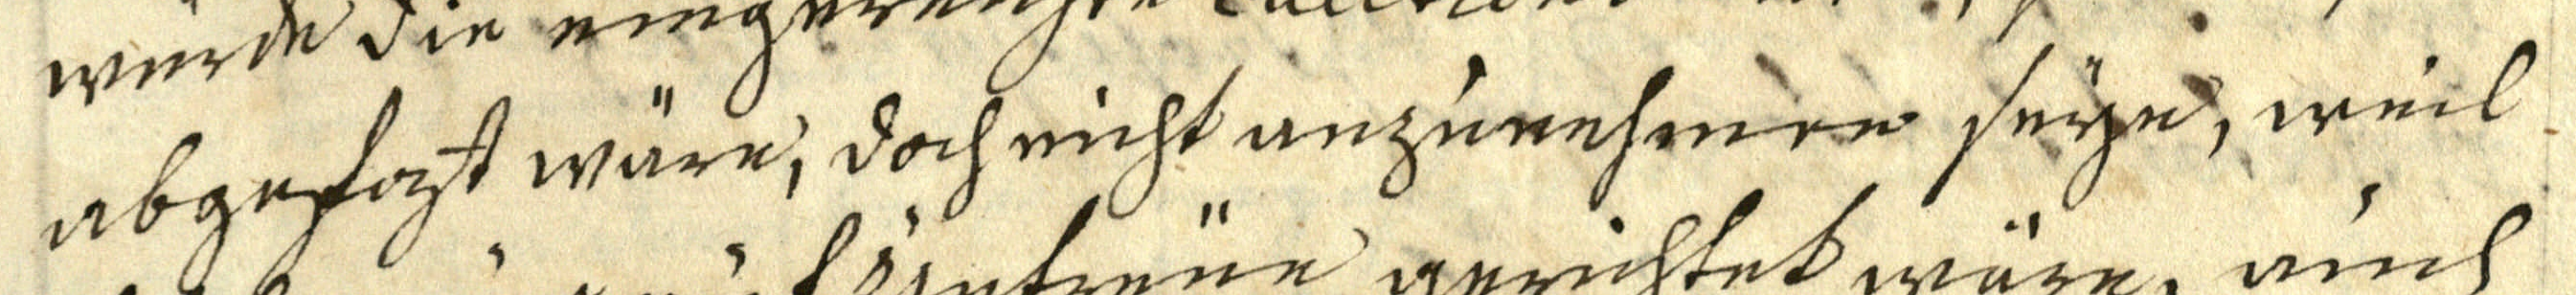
abgefast wäre, doch nicht anzunehmen seÿn, weil
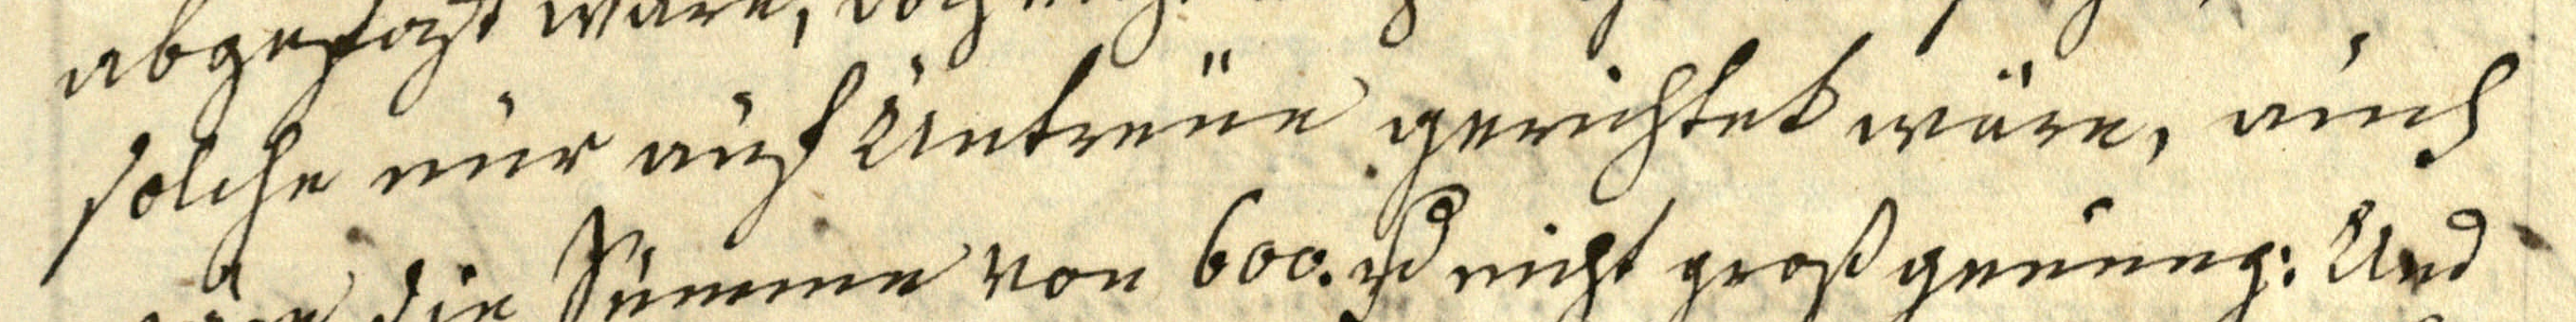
solche nur auf Untreue gerichtet wäre, auch
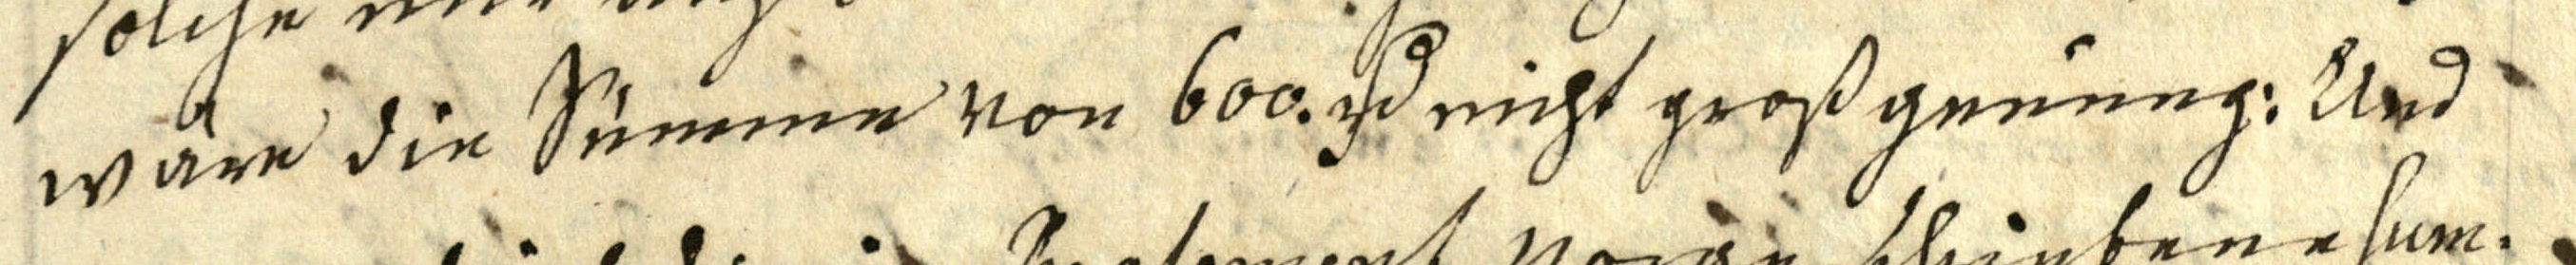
wäre die Summe von 600. rt nicht groß genung: Und
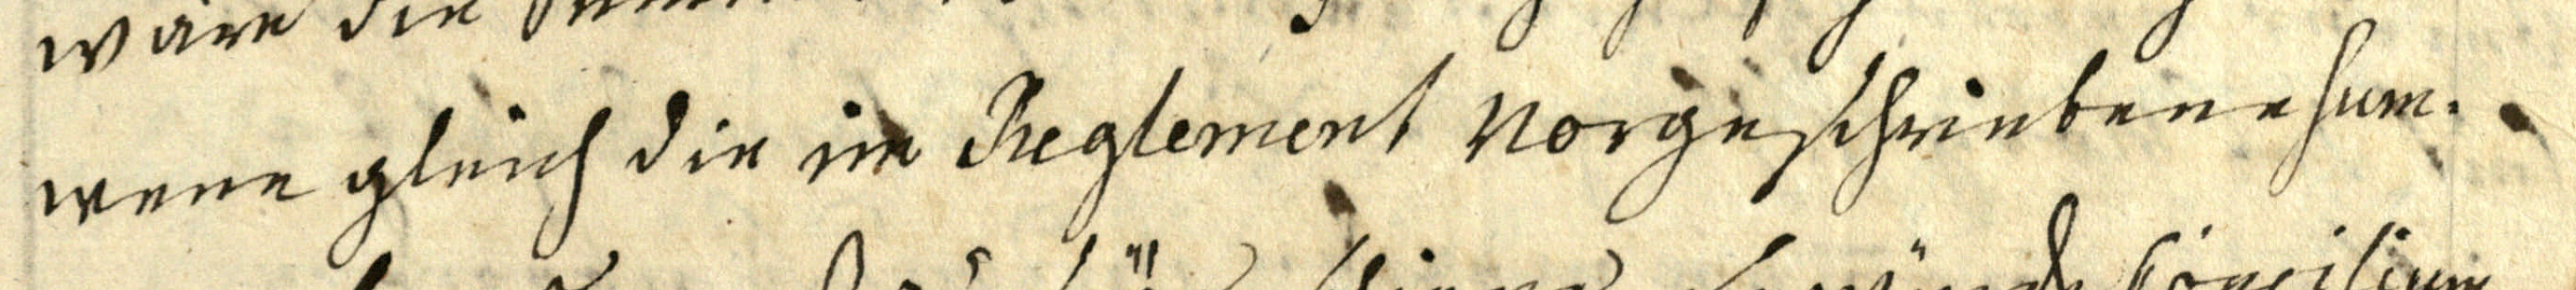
wenn gleich die im Reglement vorgeschriebene Sum¬
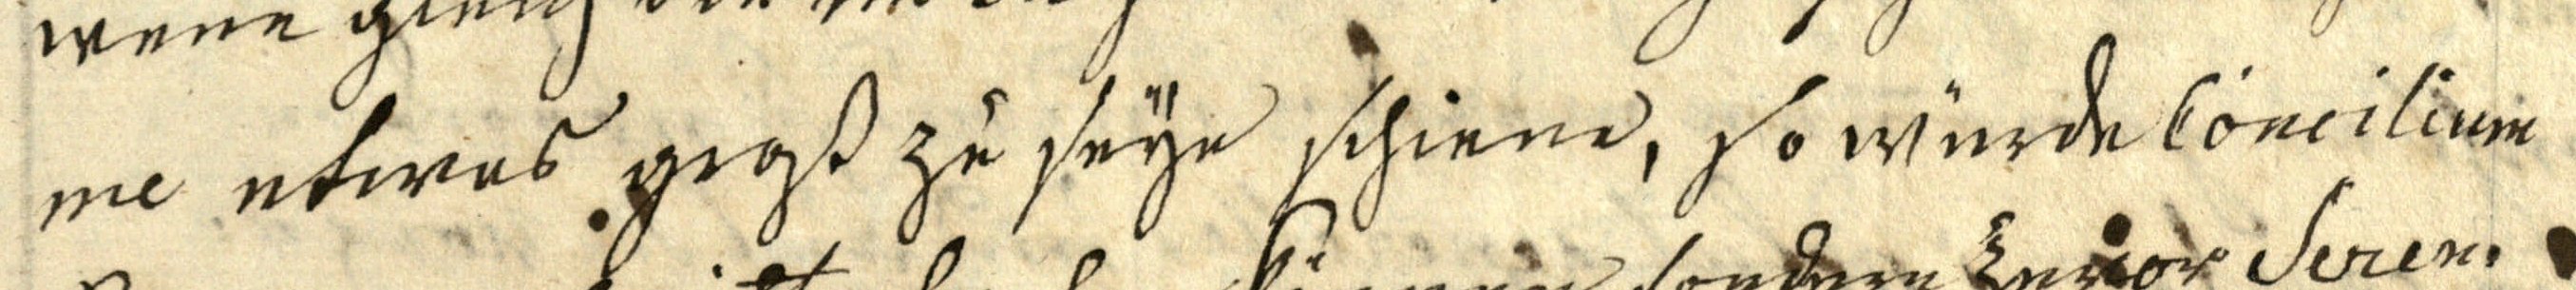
me etwas groß zu seÿn schiene, so würde Concilium
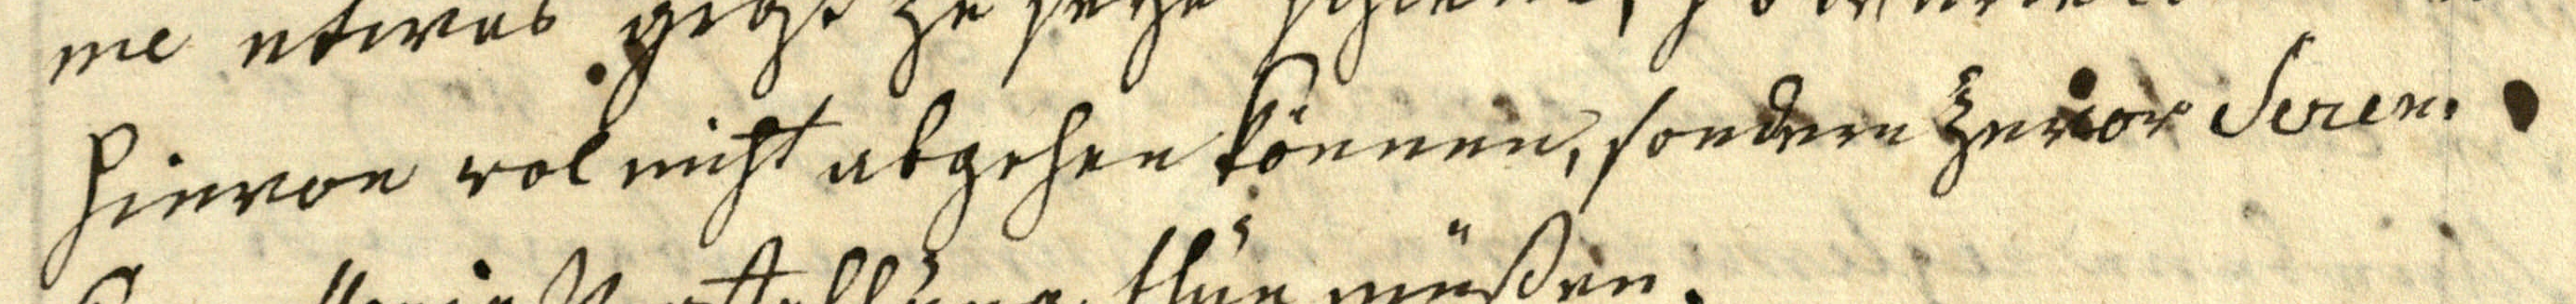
hievon wol nicht abgehen können, sondern zuvor Seren.
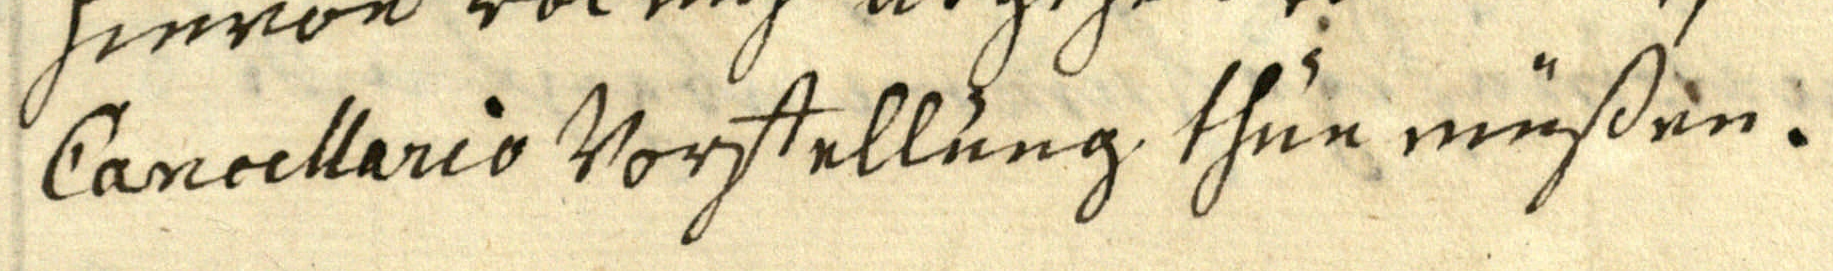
Cancellario Vorstellung thun müßen.
